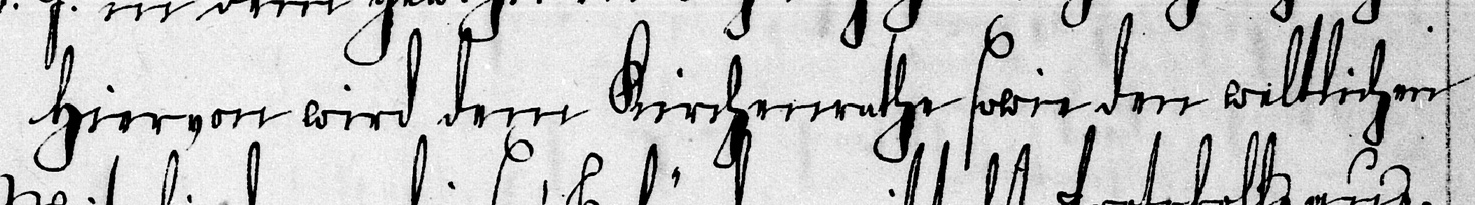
Hiervon wird dem Kirchenrathe sowie den weltlichen
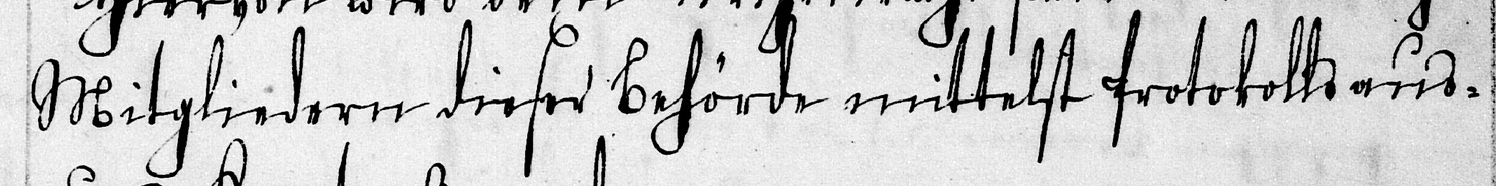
Mitgliedern dieser Behörde mittelst Protokollsaus¬
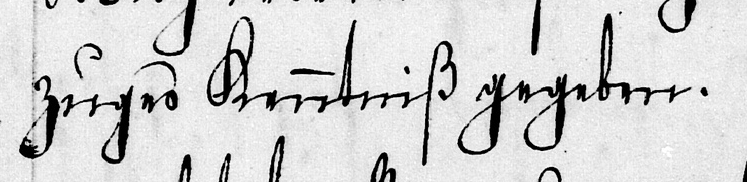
zuges Kenntniß gegeben.
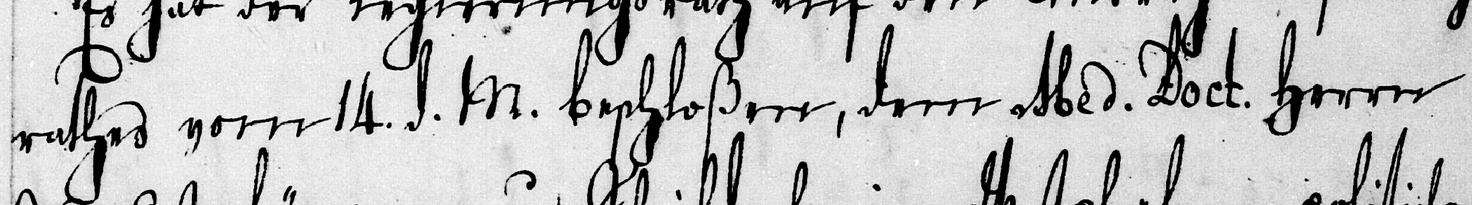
rathes vom 14. d. M. beschloßen, dem Med. Doct. Herrn
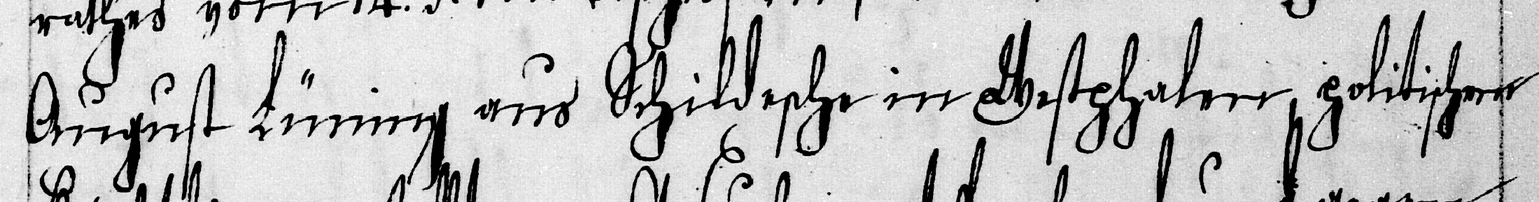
August Lüning aus Schildesche in Westphalen, politischen
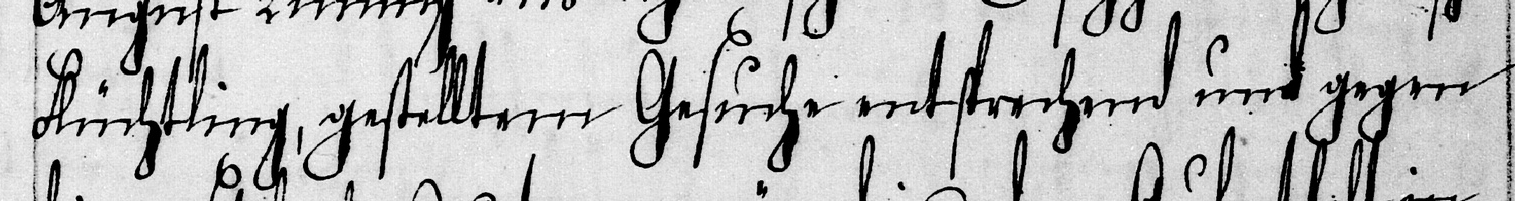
Flüchtling, gestelltem Gesuche entsprechend und gegen
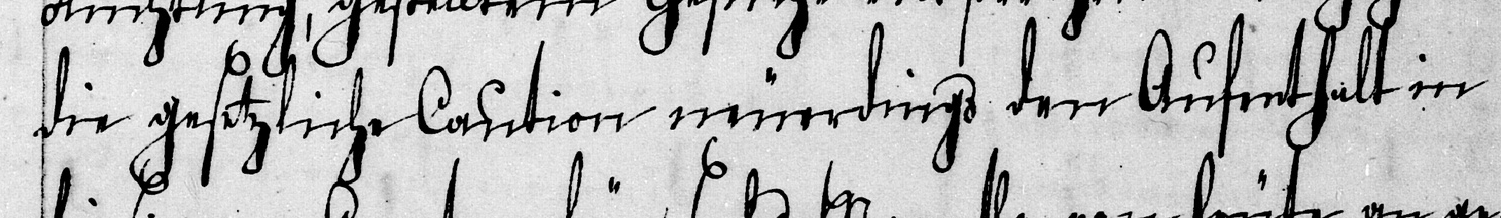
die gesetzliche Caution neuerdings den Aufenthalt in
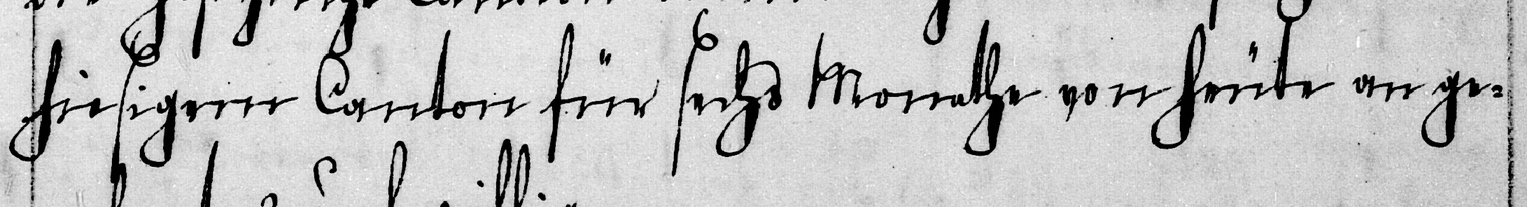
hiesigem Canton für sechs Monathe von heute an ge¬
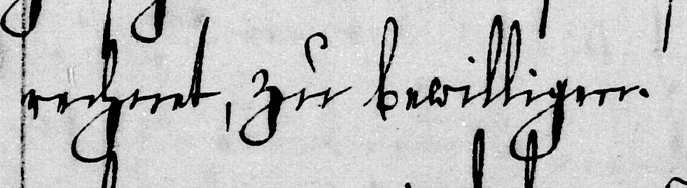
rechnet, zu bewilligen.
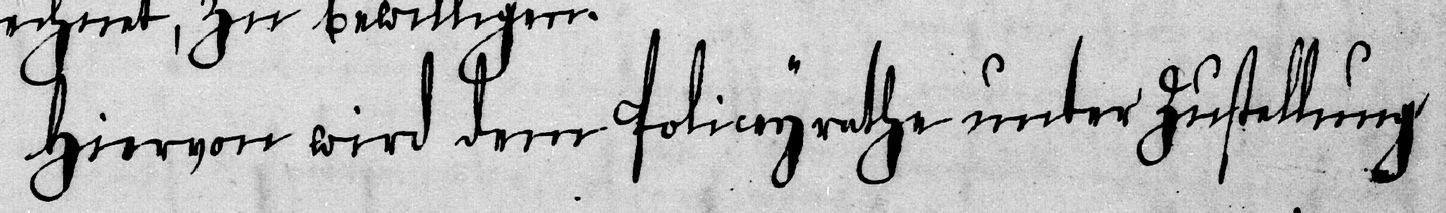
Hiervon wird dem Policeyrathe unter Zustellung
